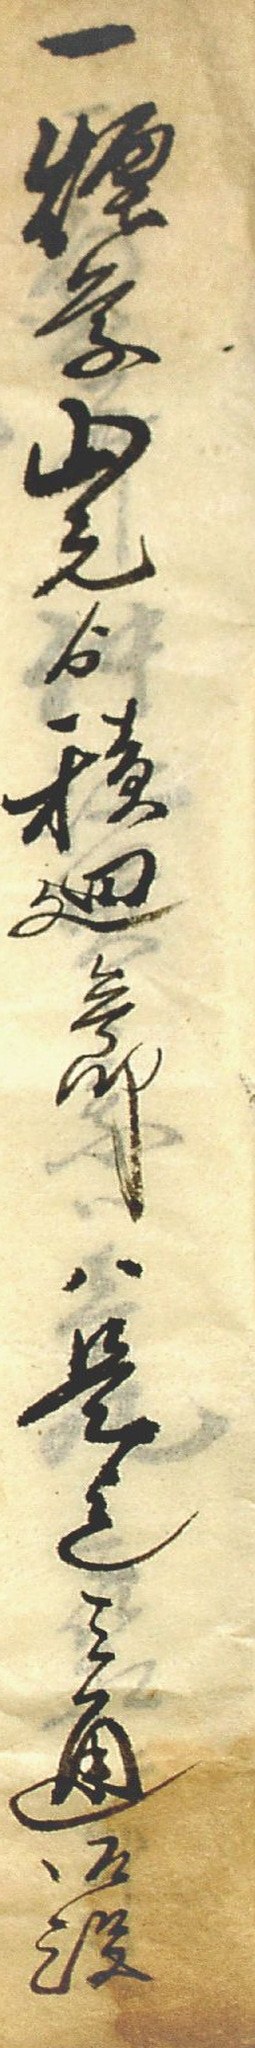一煙草山元ゟ積廻候節は是迄之通御役
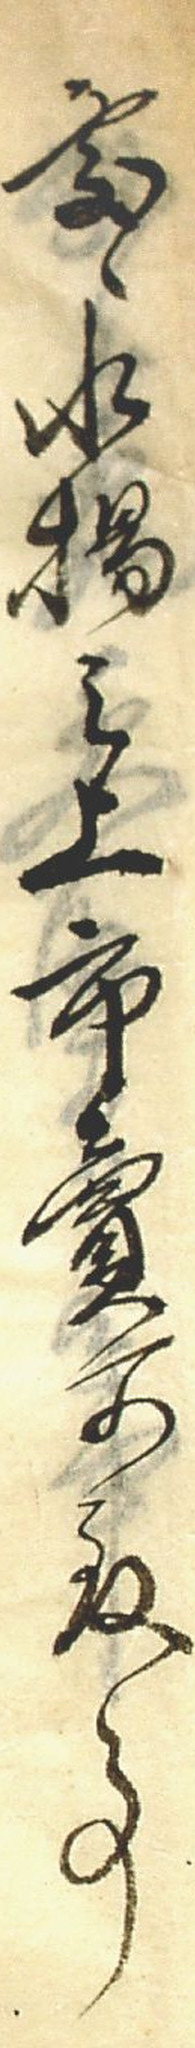処へ水揚之上市売可致事
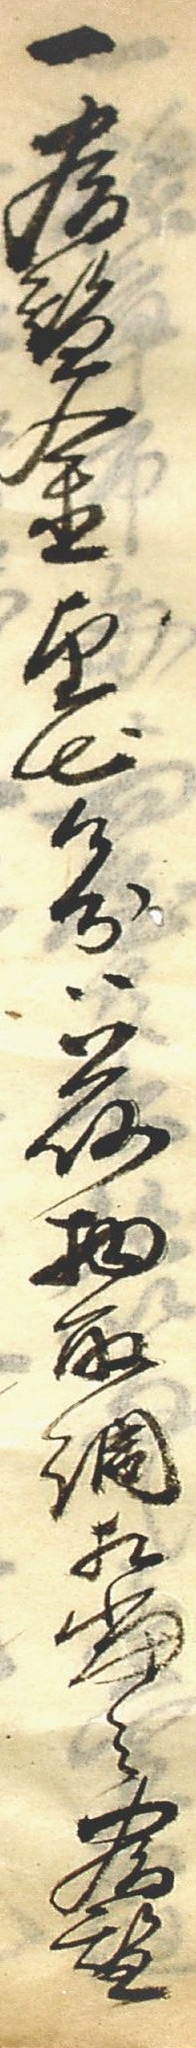一為替金望出候分は荷物取調相当之為替
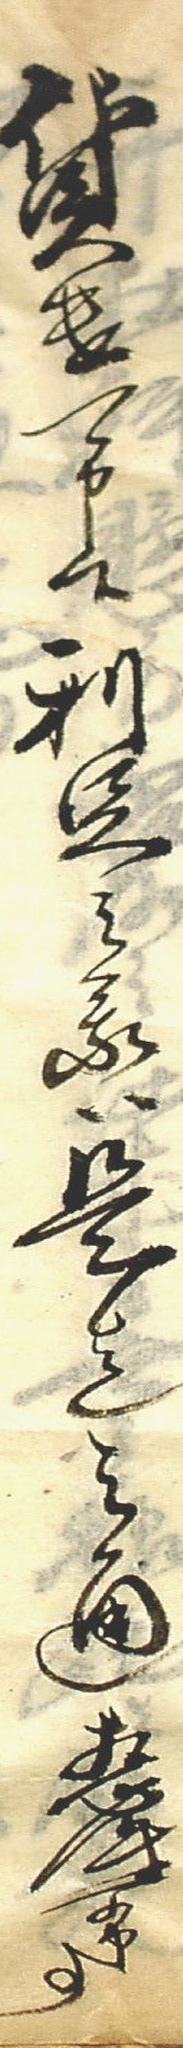貸遣可申候利足之義は是迄之通相心得可申事
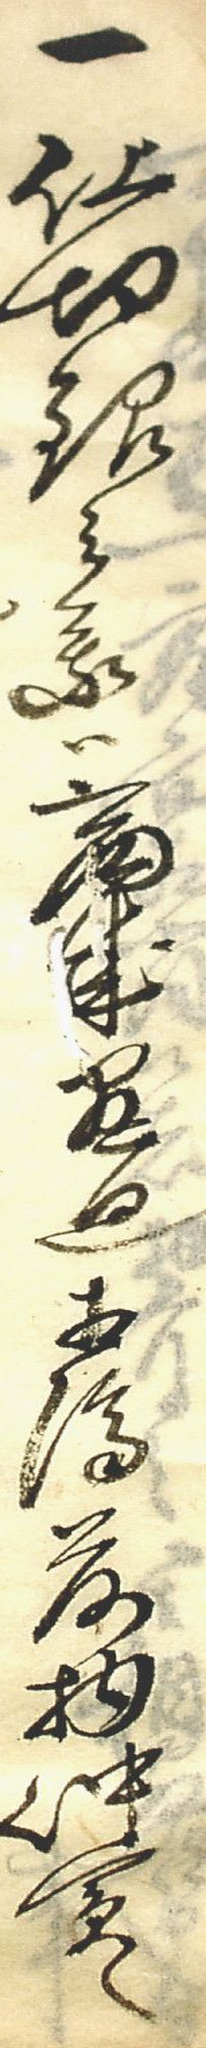一仕切銀之義は商成懸廻相済荷物仲買へ
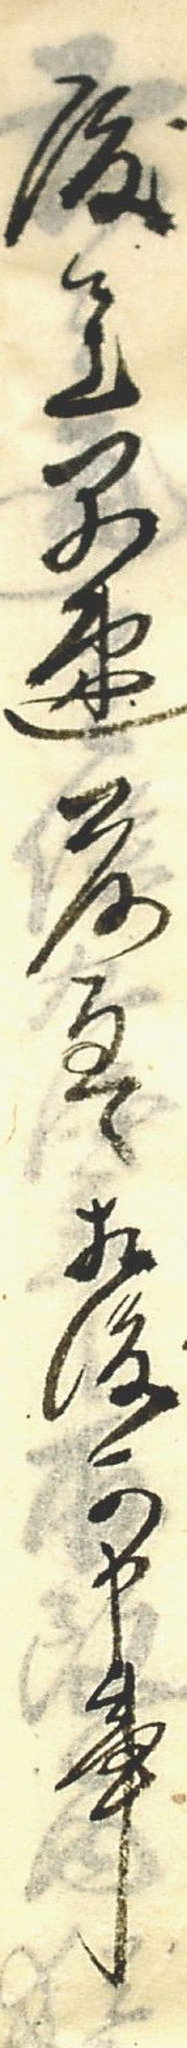渡候上早速荷主へ相渡可申事
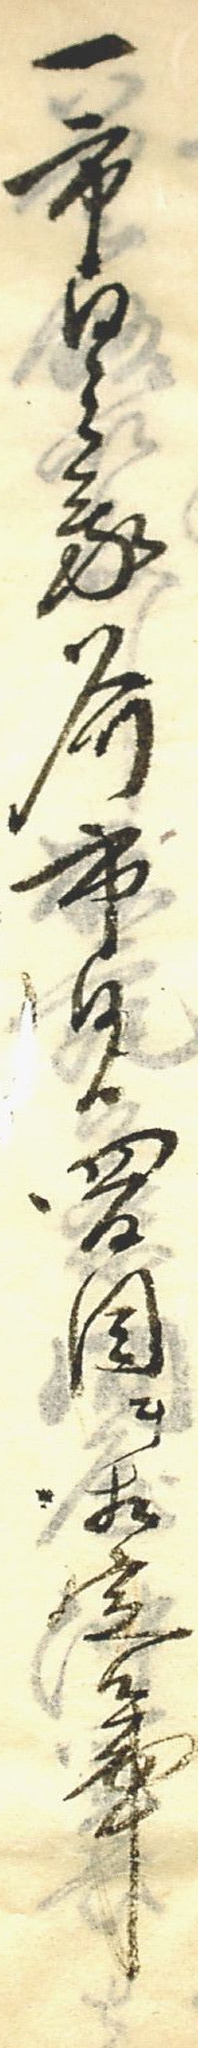一市日之義前市日ゟ四日目を相定候事
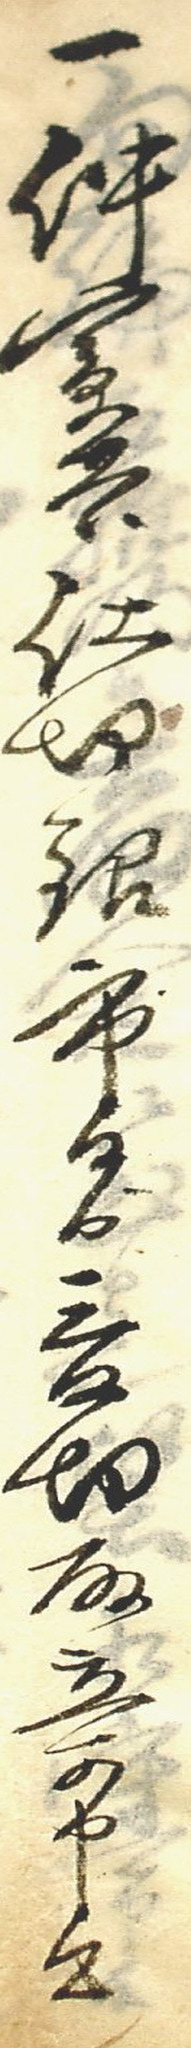一仲買共仕切銀市日ゟ三日切取立可申候
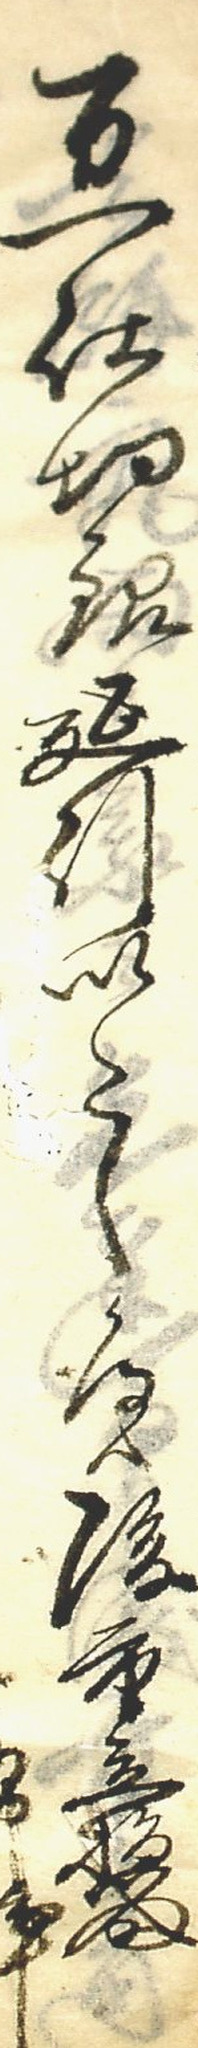万一仕切銀延引いたし候得は後市立指留可申事
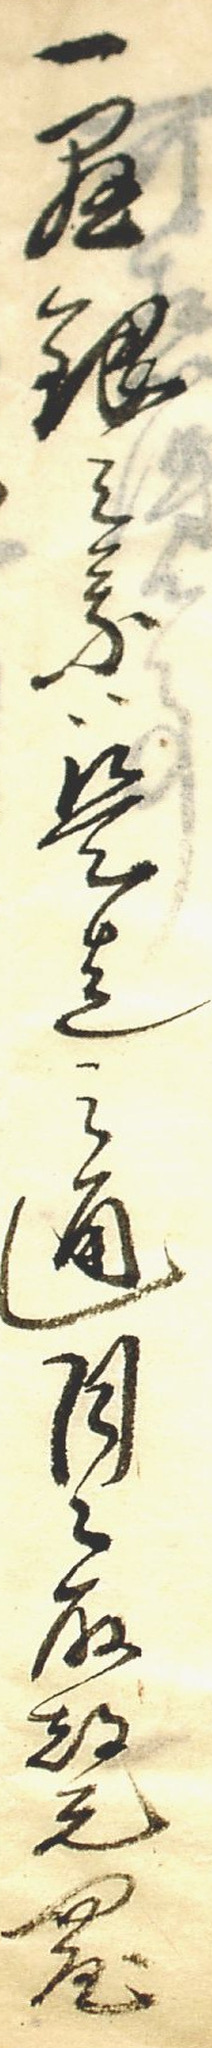一懸銀之義は是迄之通月々取都元問屋
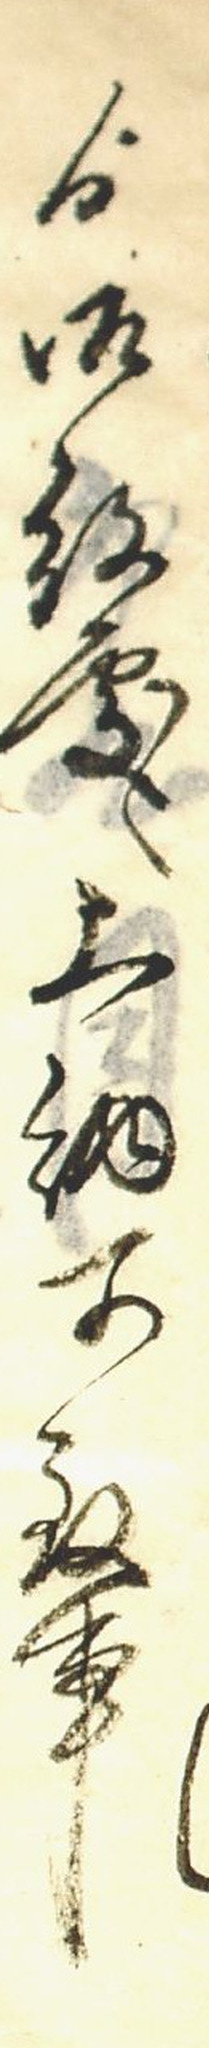ゟ御役処へ上納可致事
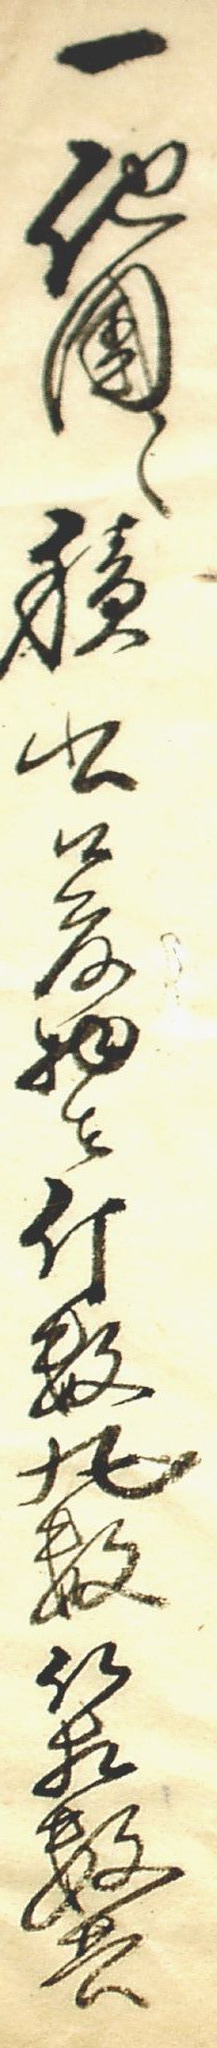一他国へ積出候荷物は斤数丸数箱数共
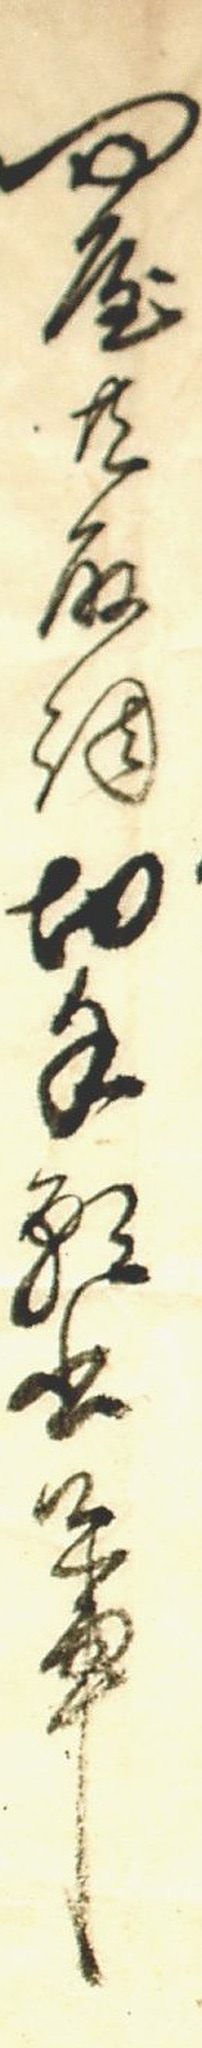問屋共取調切手願出候事
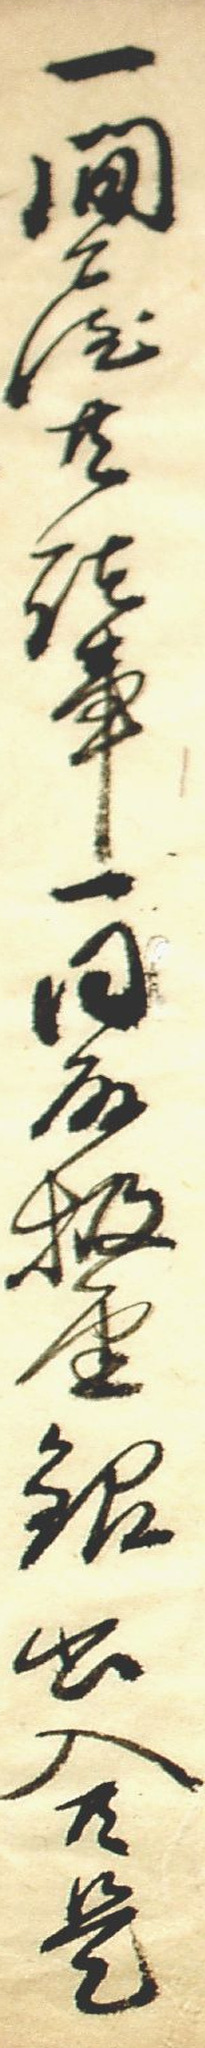一問屋共諸事一同取扱金銀出入共是
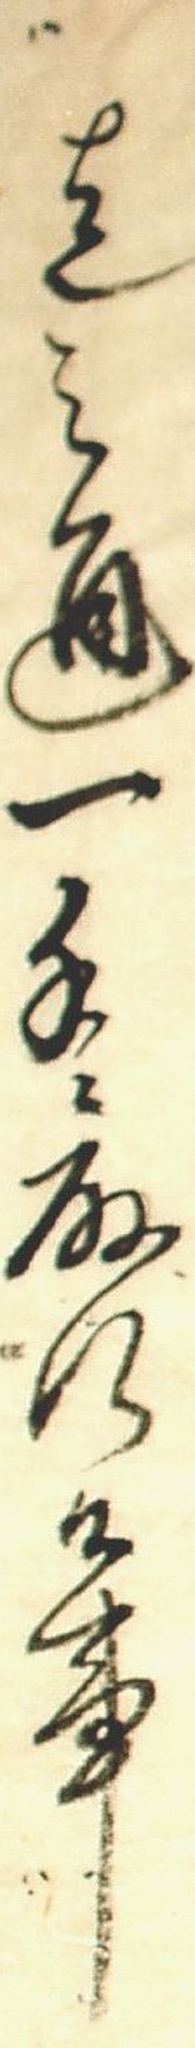迄之通一手に取行候事
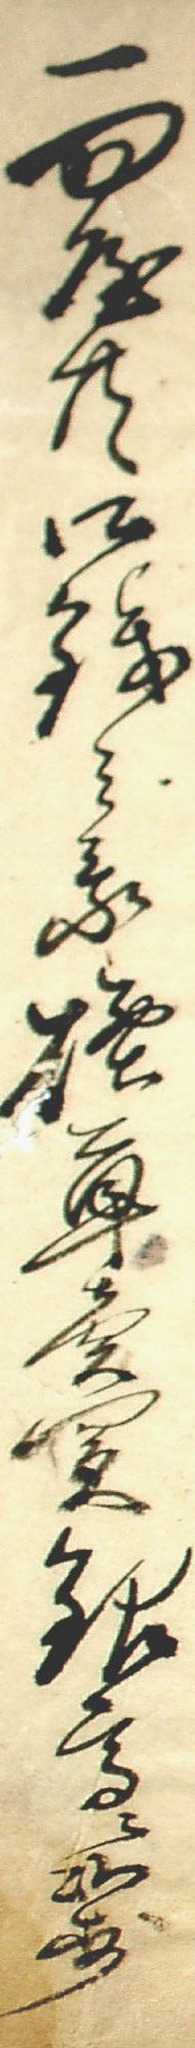一問屋共口銭之義煙草売買銀高に弐歩
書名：煙草問屋扱方一件他
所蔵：鳴門教育大学 Naruto University of Education
